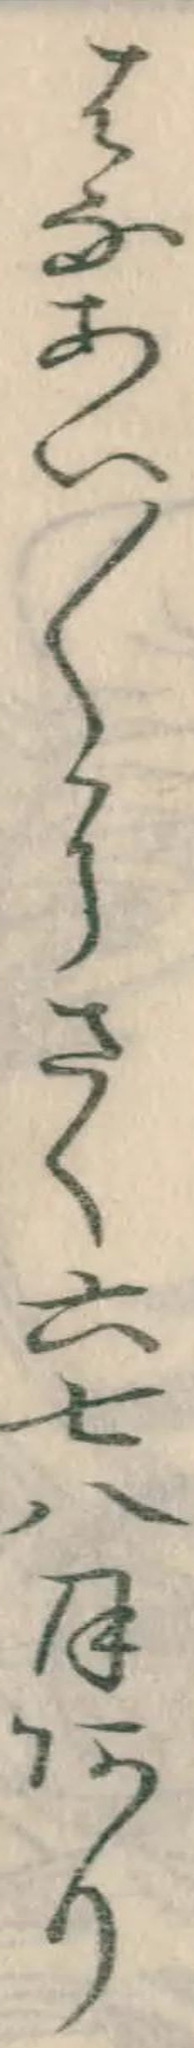はなあい〳〵にさく六七八月あり
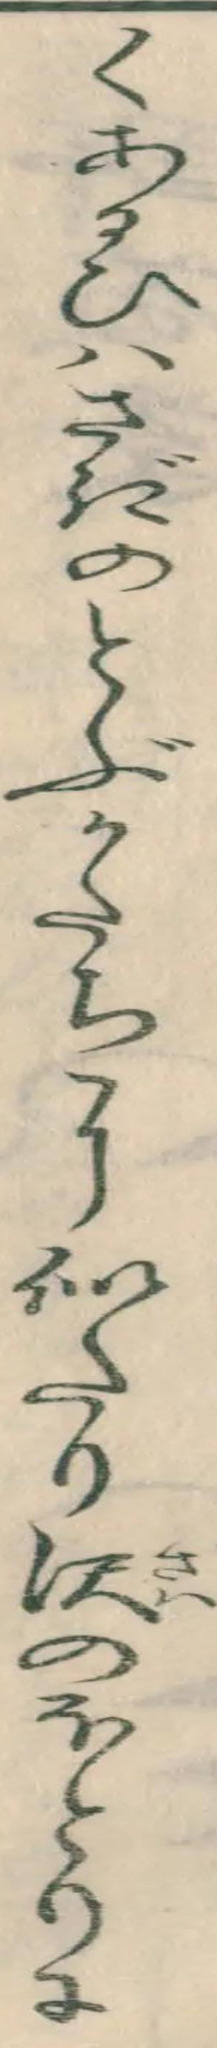くあるひはさぎのとぶかたちに似たり沢のほとりに
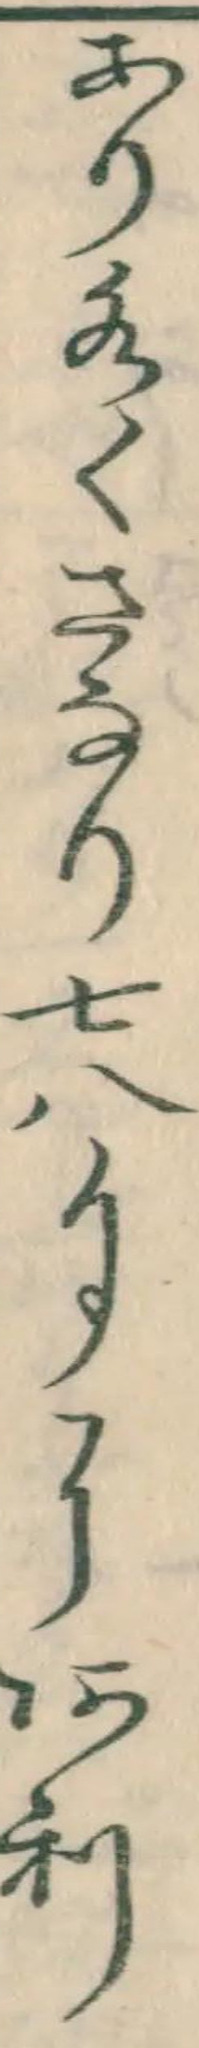あり水くさなり七八月にあり

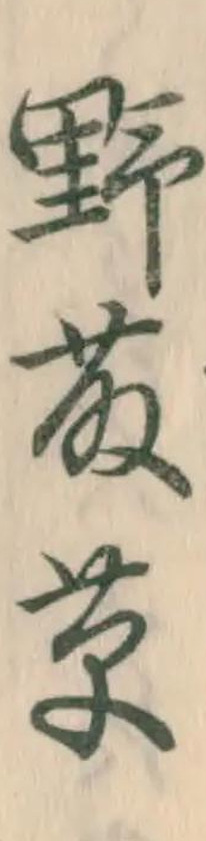野藤草
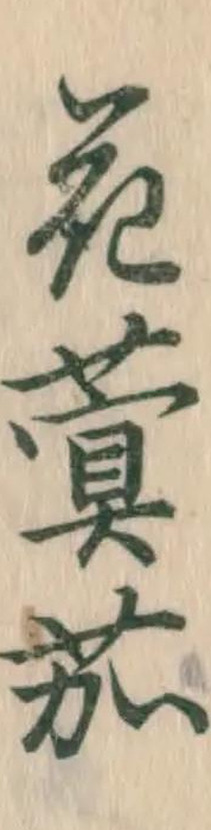花蓂茄
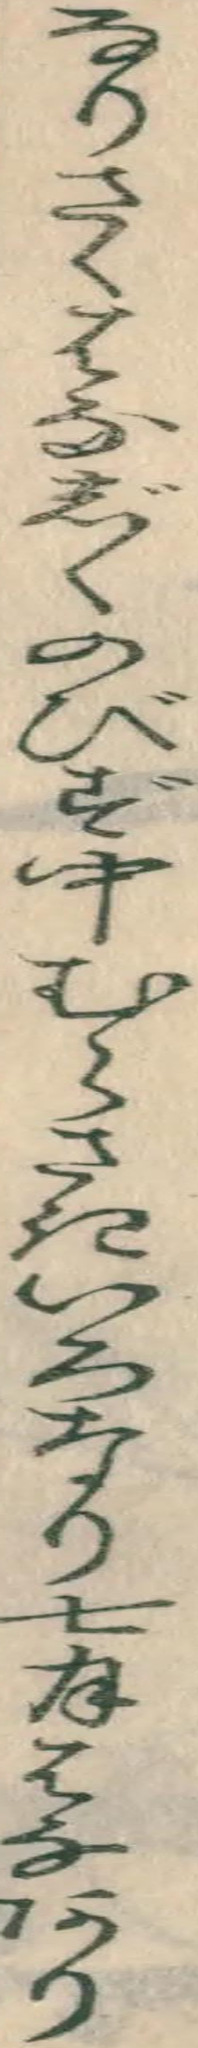なりさくはなじくのびず中むらさきいろなり七月はなあり
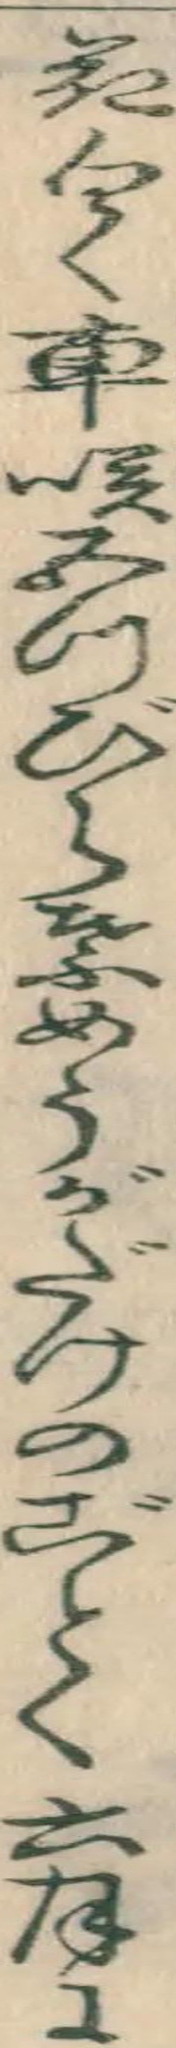花白く車咲五つびら葉めうがだけのごとく六月に
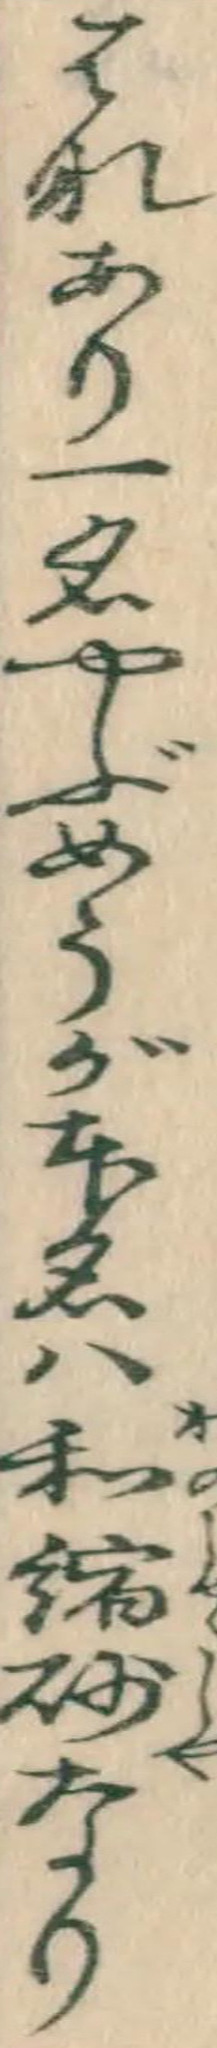はなあり一名やぶめうが本名は和縮砂なり

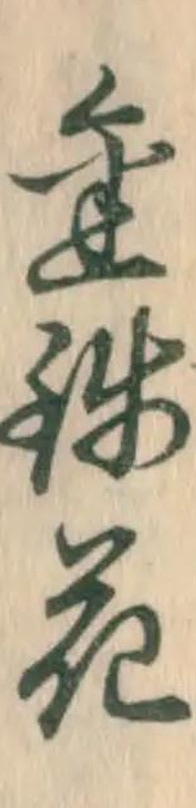金銭花

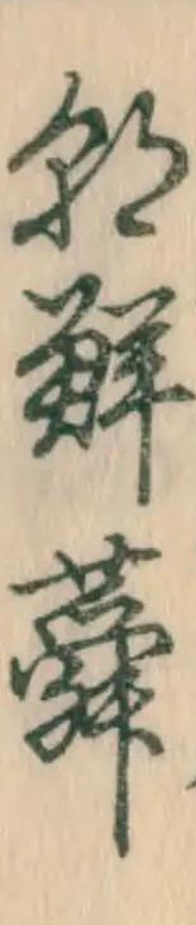朝鮮蕣
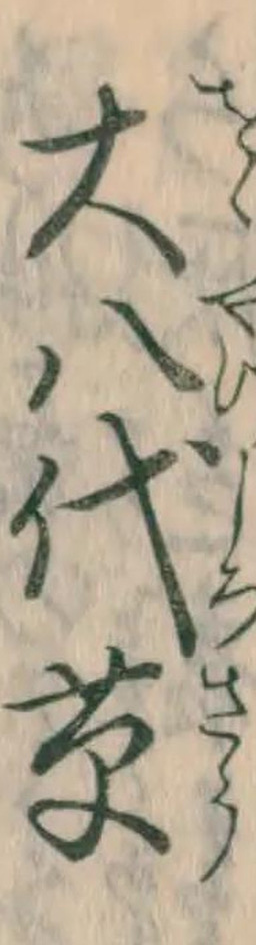大八代草

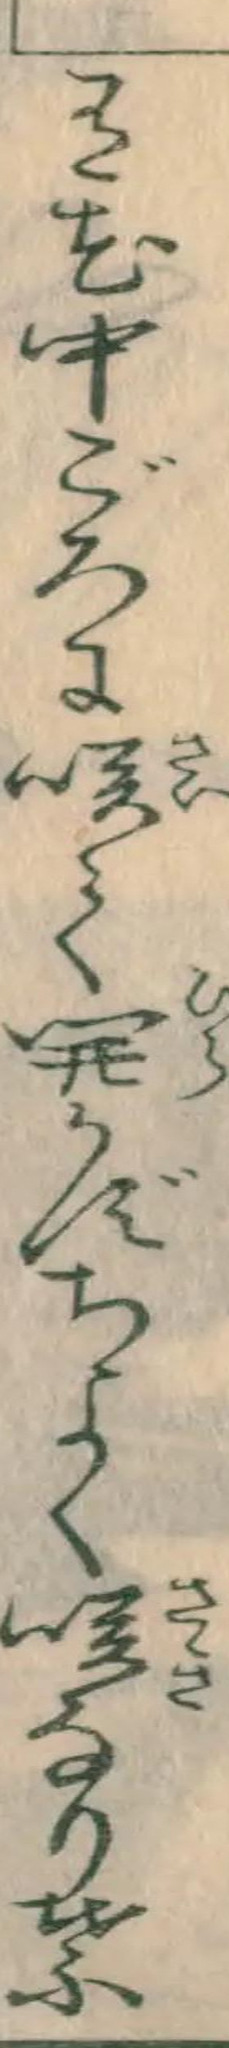有花中ごろに咲て開かずちよく咲なり葉
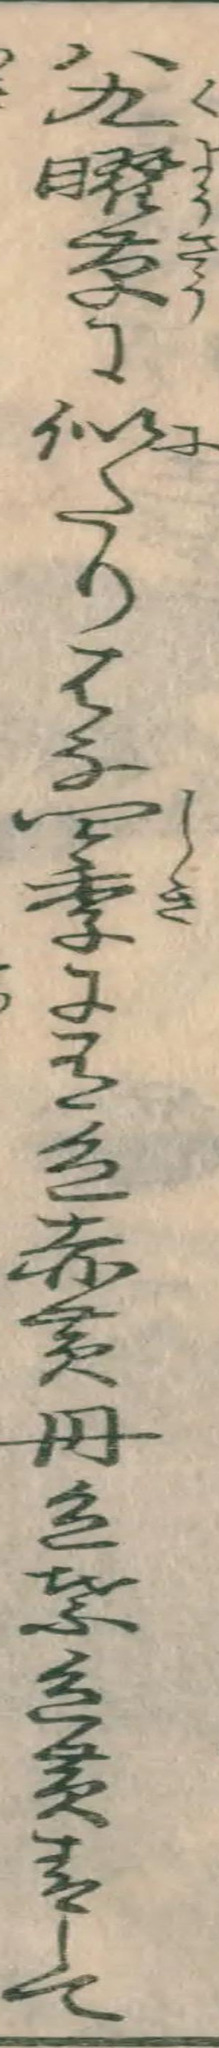は九曜草に似たりはな四季に有色赤黄丹色葉色黄青して
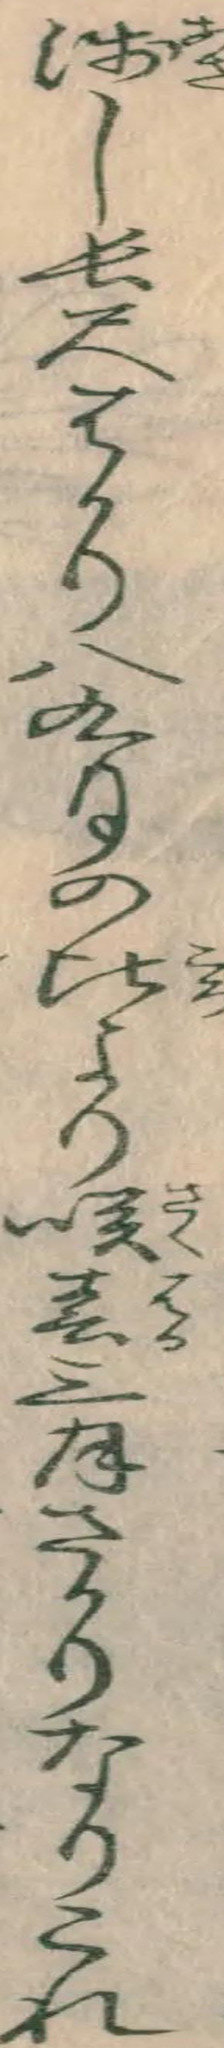浅し長尺はかり八九月の比より咲春三月さかりなりこれ
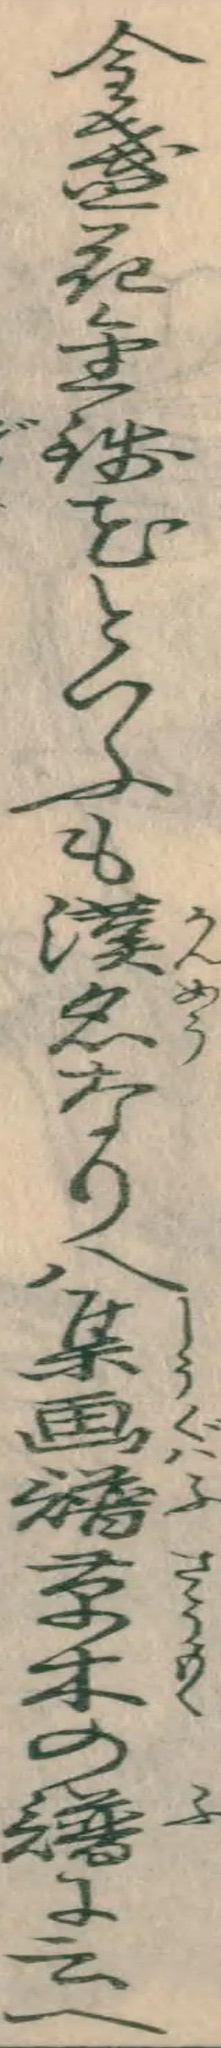金盞花金銭花といふも漢名なり八集画譜草木の譜に云へ
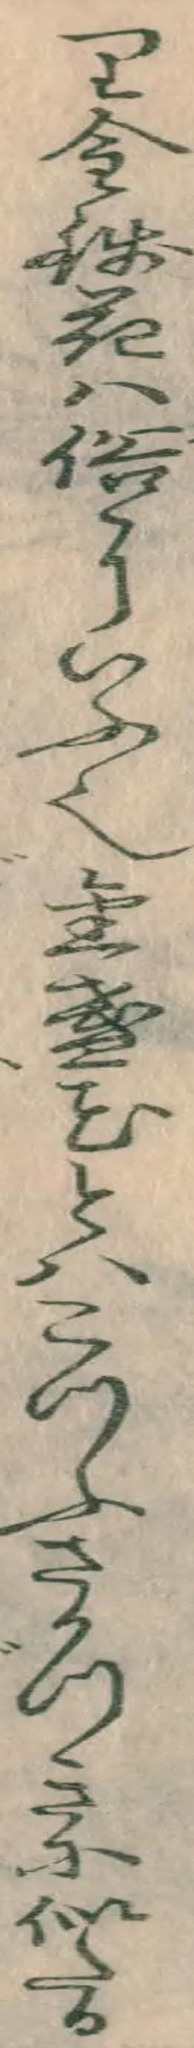り金銭花は俗にいふ也金盞花とはこつふさかつきに似たる
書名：畫本野山草. [4]
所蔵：国立国会図書館 National Diet Library, JAPAN
